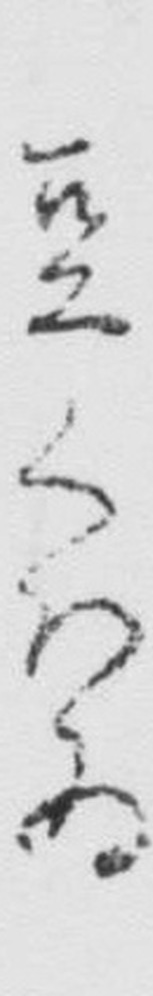豆くはゐ
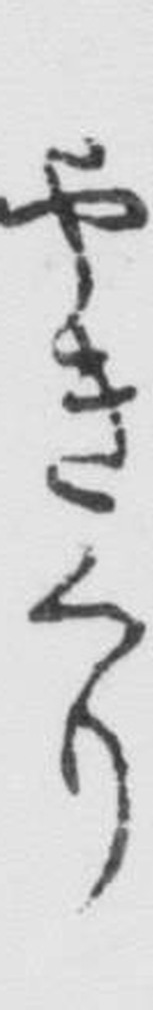やきくり
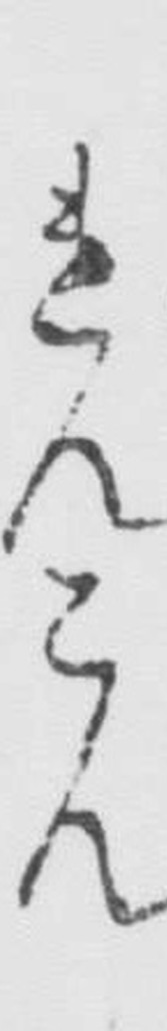れんこん
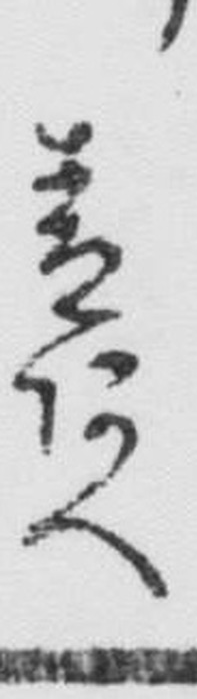青あへ
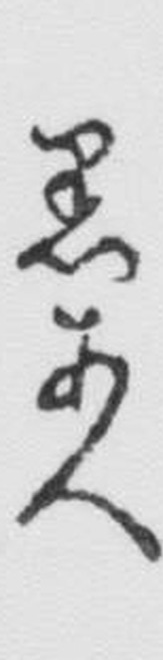黒あへ
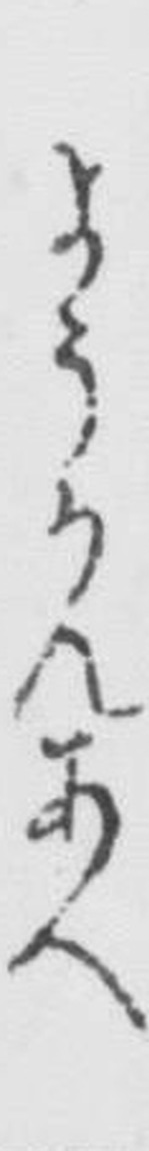ようかんあへ

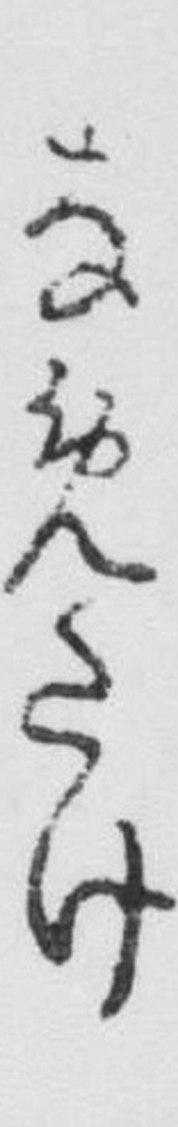なめたけ
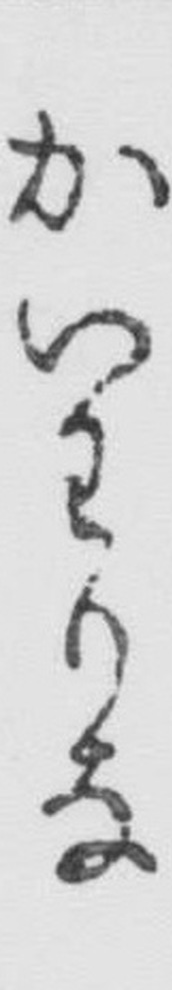かいわりな
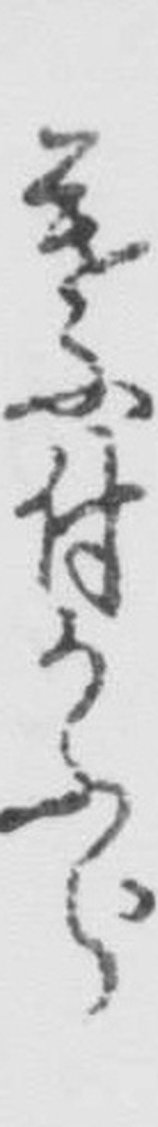葉付かふら
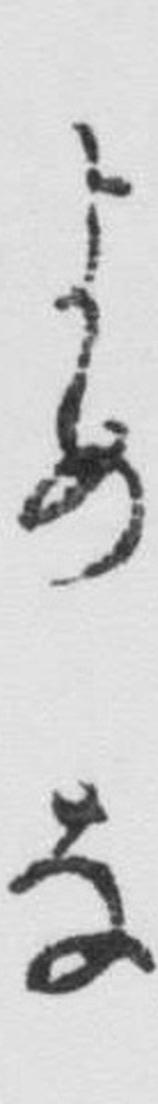よめな
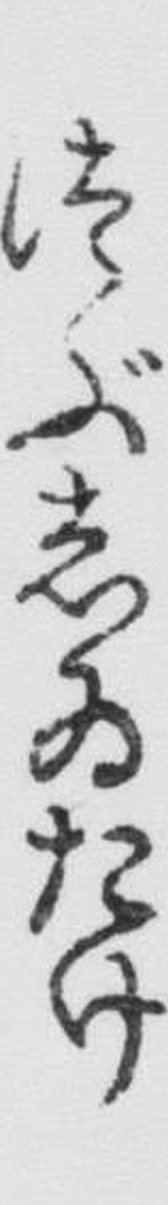つぶしゐたけ
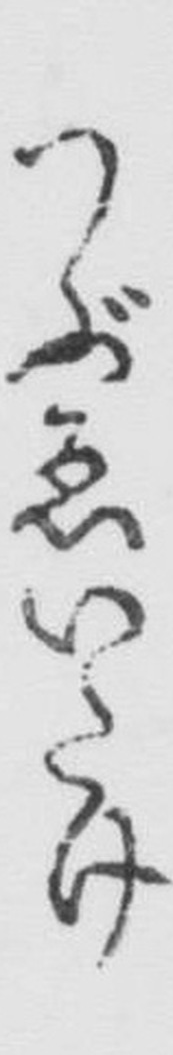つぶゑいたけ
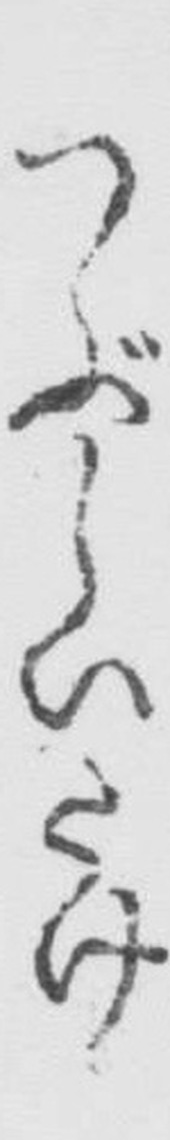つぶしいたけ
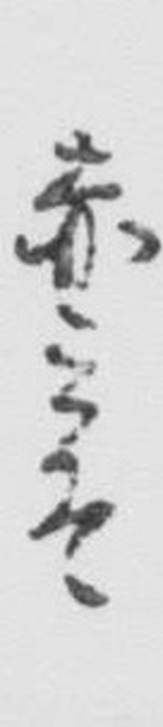赤みそ
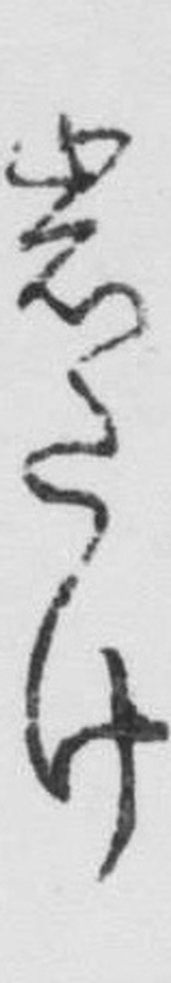岩たけ
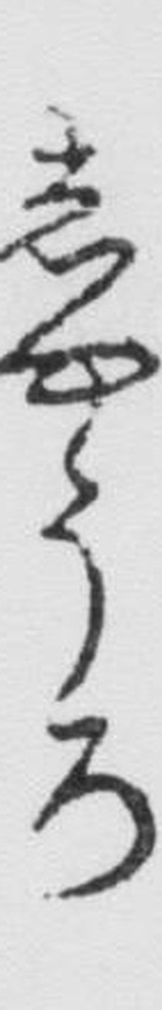しやうろ
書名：諸家通用/即席料理
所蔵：大阪府立大学学術情報センター 国文学研究資料館
